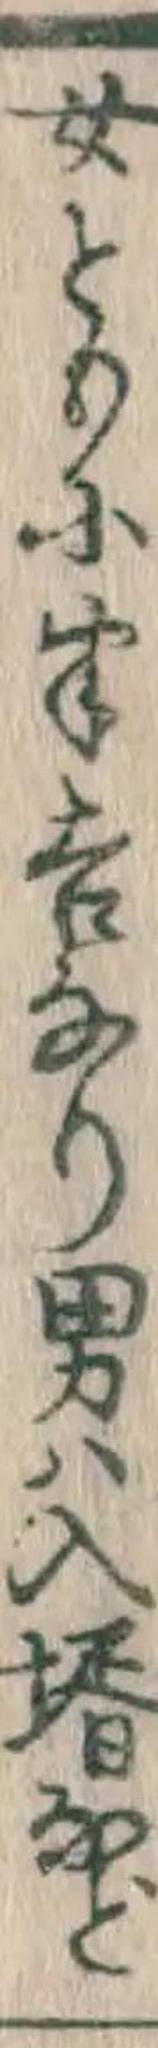女ともに半吉なり男は入壻など
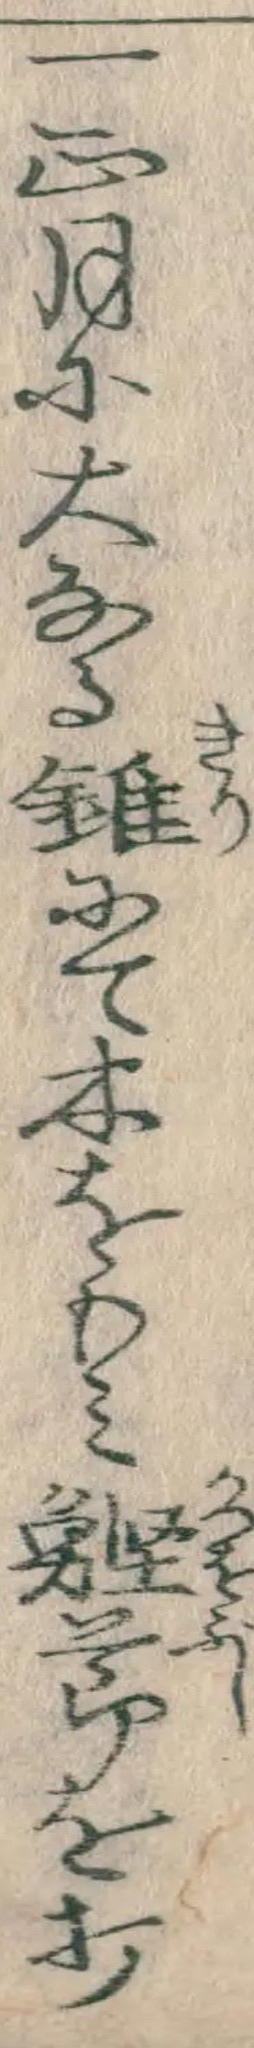一正月に大なる錐にて木をもみ鰹節を打
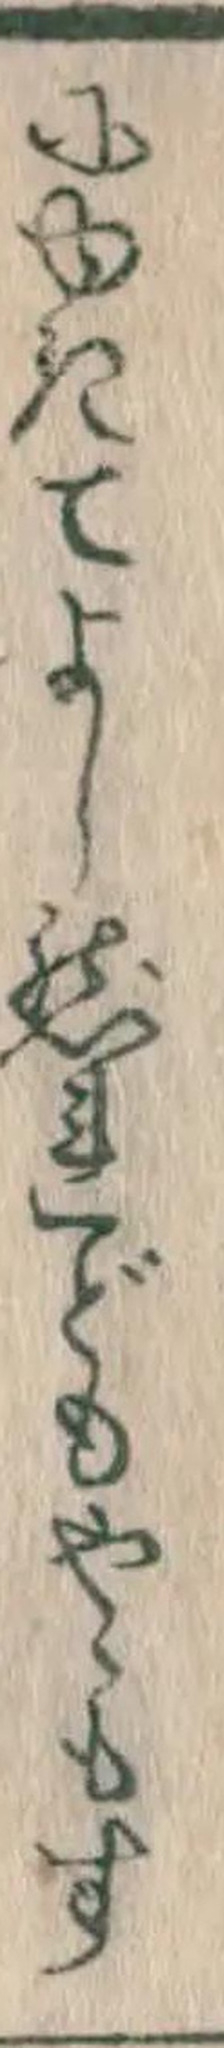にゆきてよし然れどもやゝもす
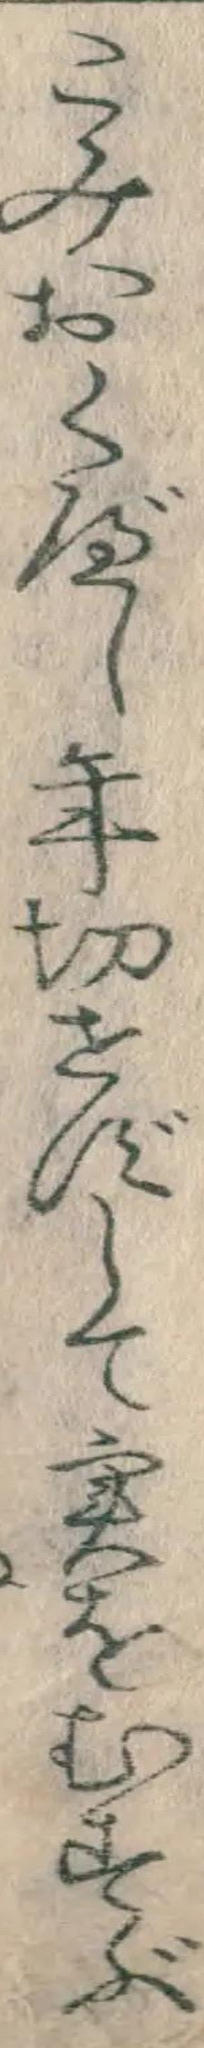こみおくべし年切せずして実をむすぶ
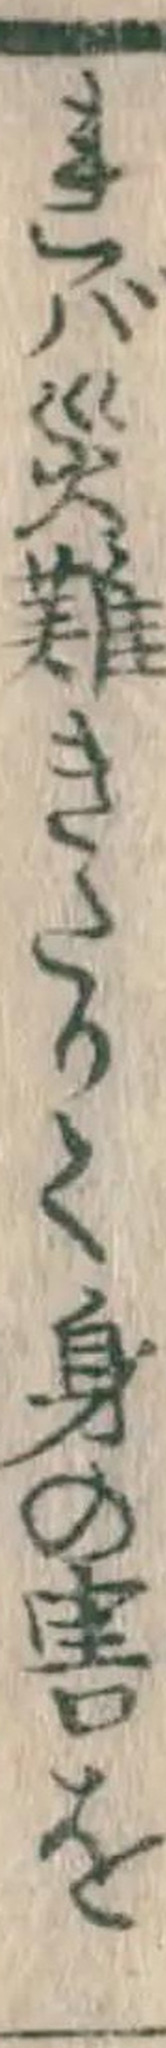れば災難きたりて身の害を
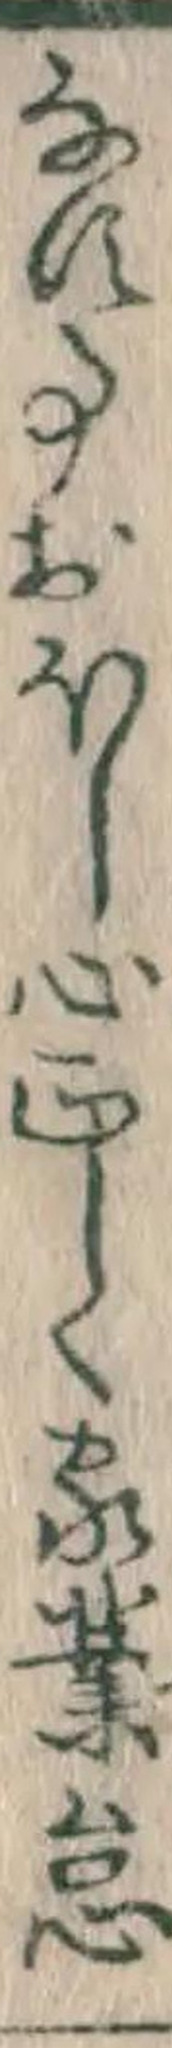なす事おほし心正しく家業怠
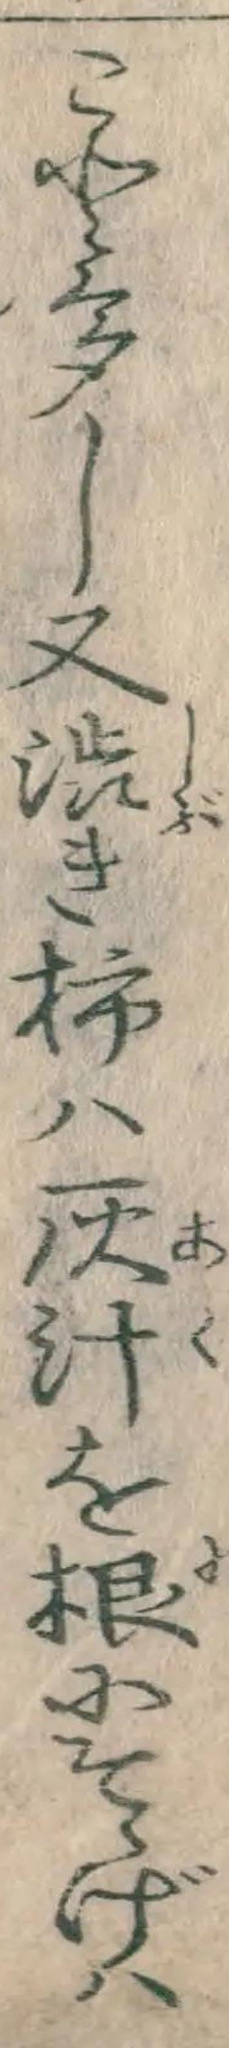こと多し又渋き柿は灰汁を根にそゝげは
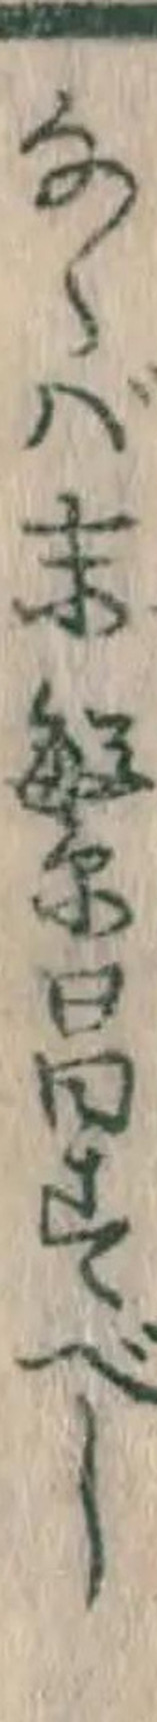なくば末繁昌すべし
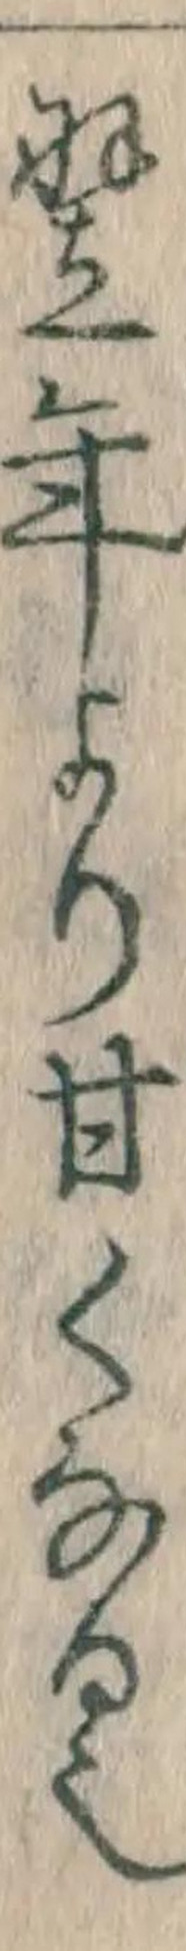翌年より甘くなる也

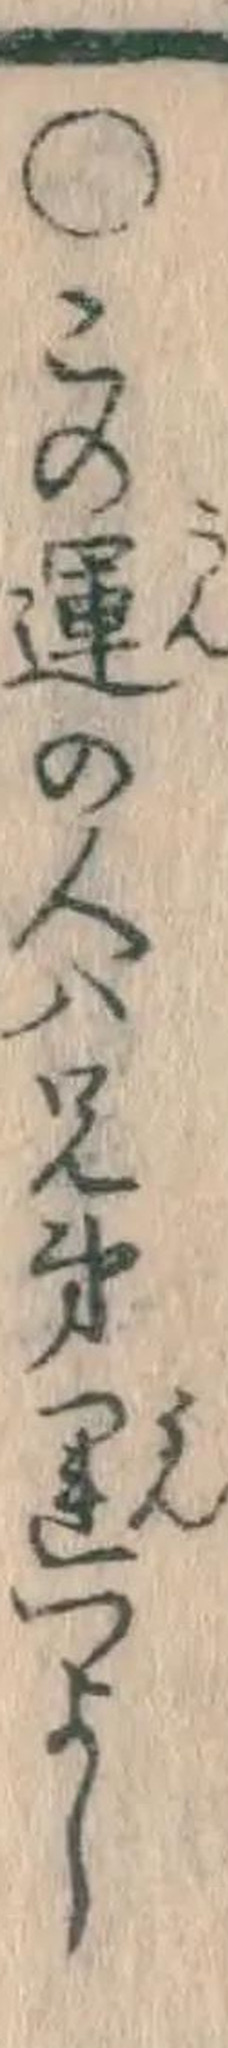○この運の人は兄弟運つよし
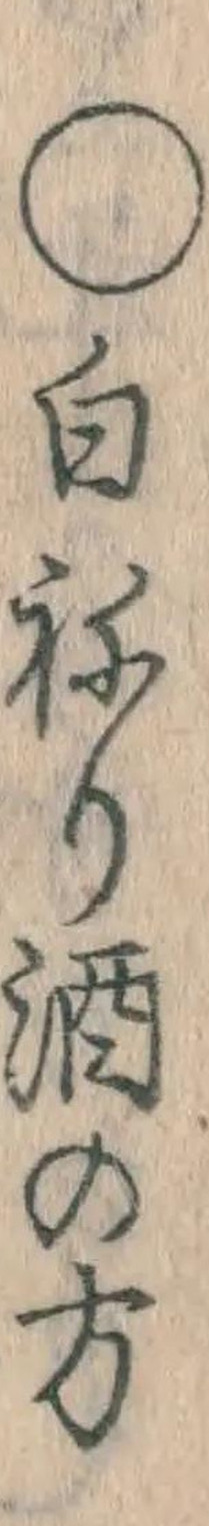○白ねり酒の方
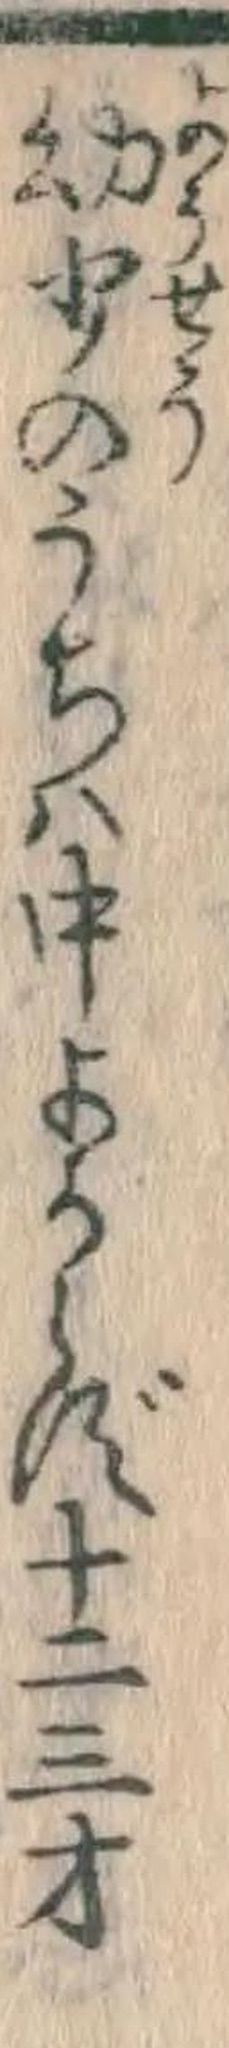幼少のうちは中よからず十二三才
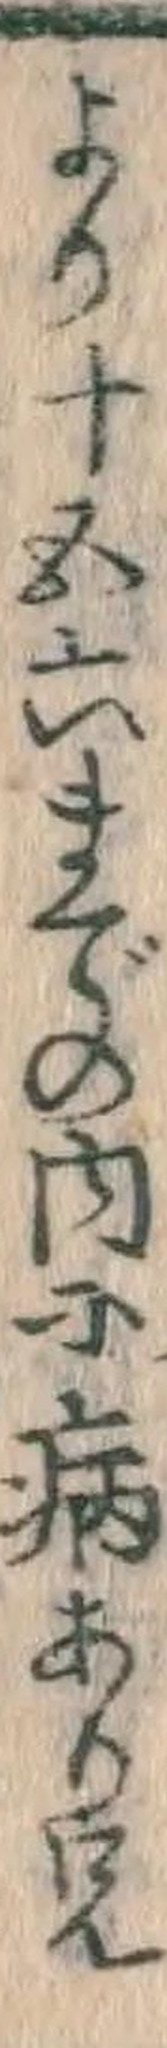より十五六までの内に病あり兄
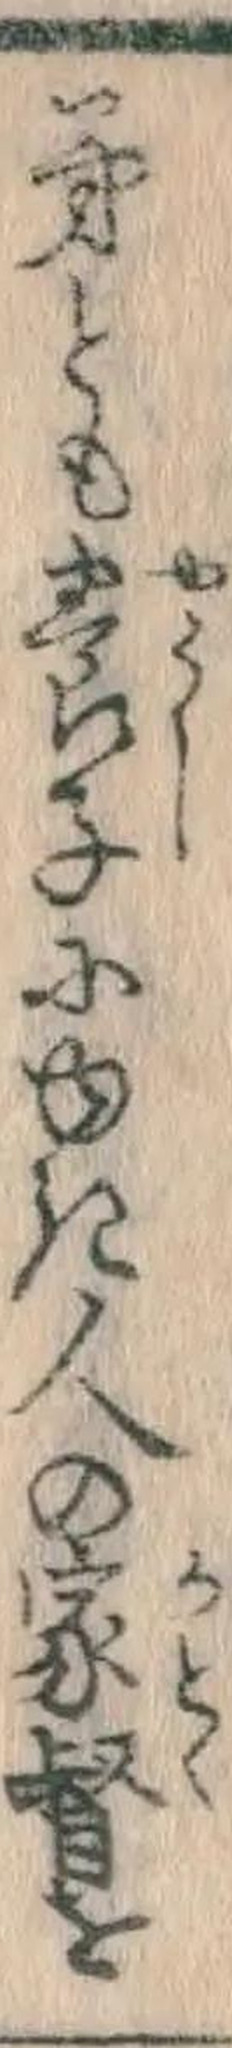弟とも養子にゆき人の家督を
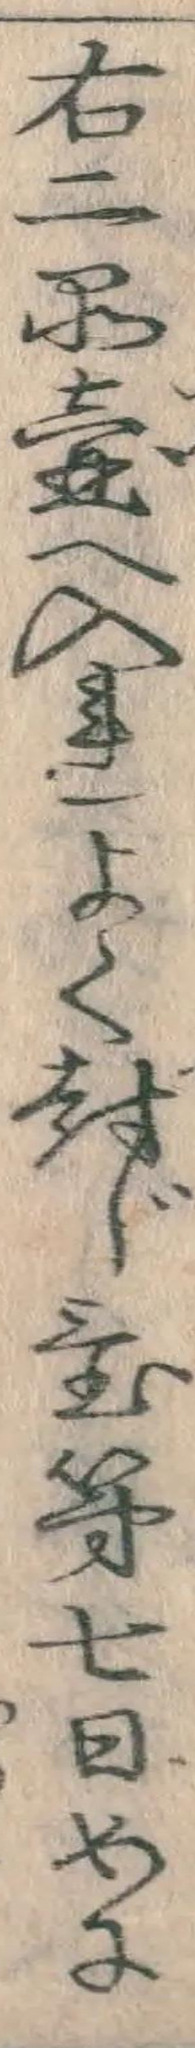右二品壺へ入れよく封じ置第七日めに
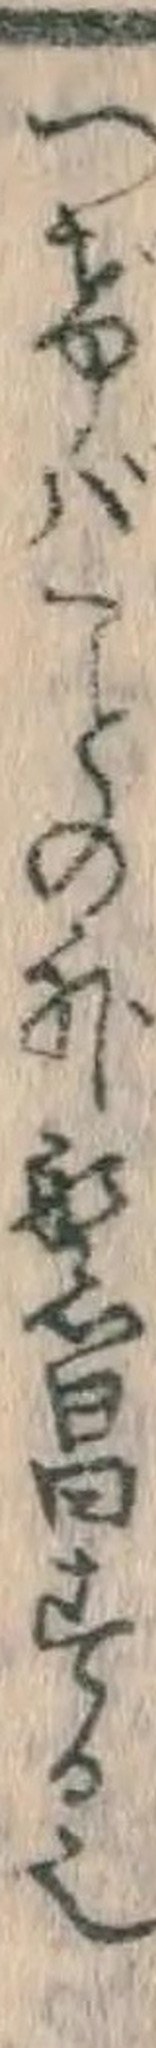つげばことの外繁昌する也
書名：広益秘事大全 3巻. [2]
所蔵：国立国会図書館 National Diet Library, JAPAN
